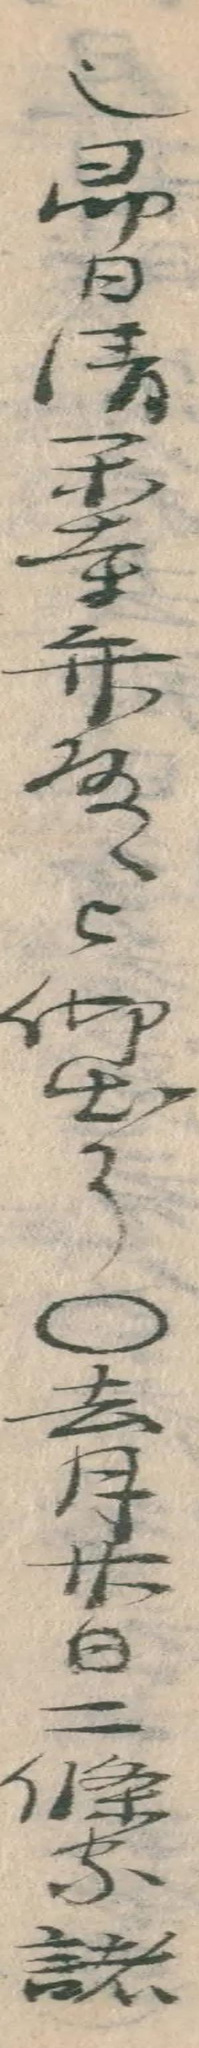也即日清閑寺弁殿へ被仰出了○去月廿日二條家諸
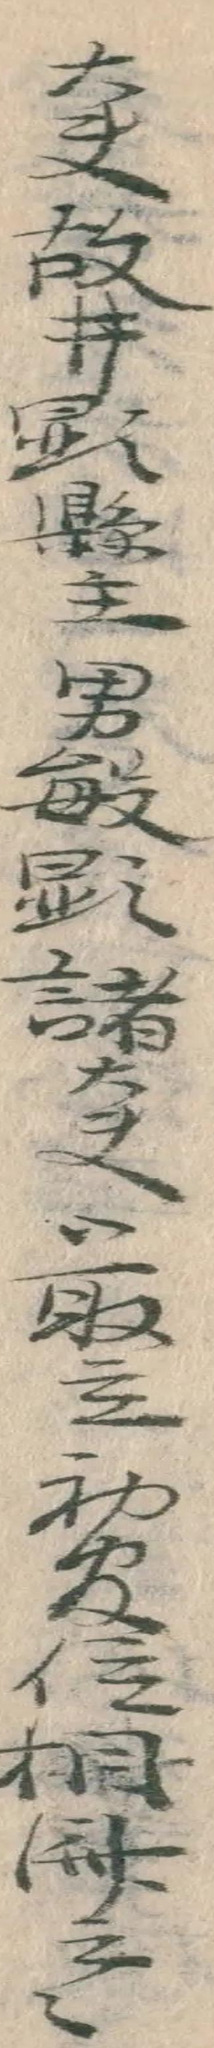大夫故井顕県主男敏顕諸大夫御取立初官位相済云々
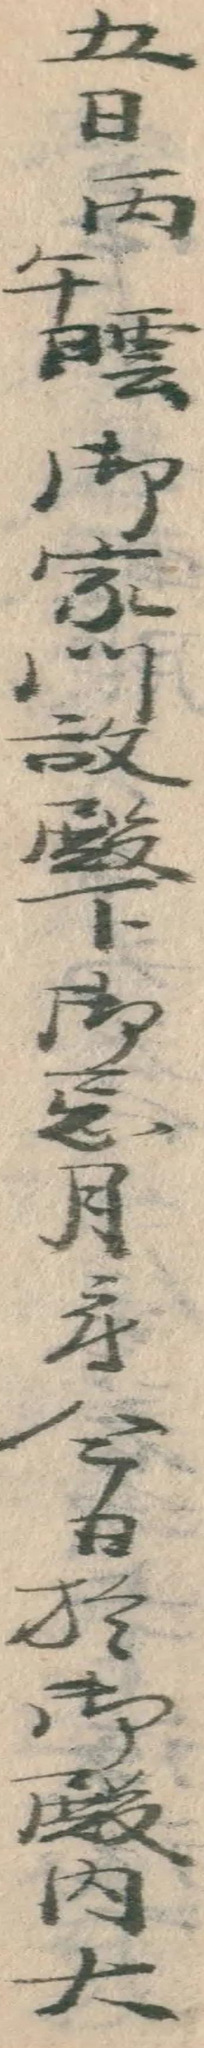五日丙午曇御家門故殿下御忌月ニ付今日於御殿内大
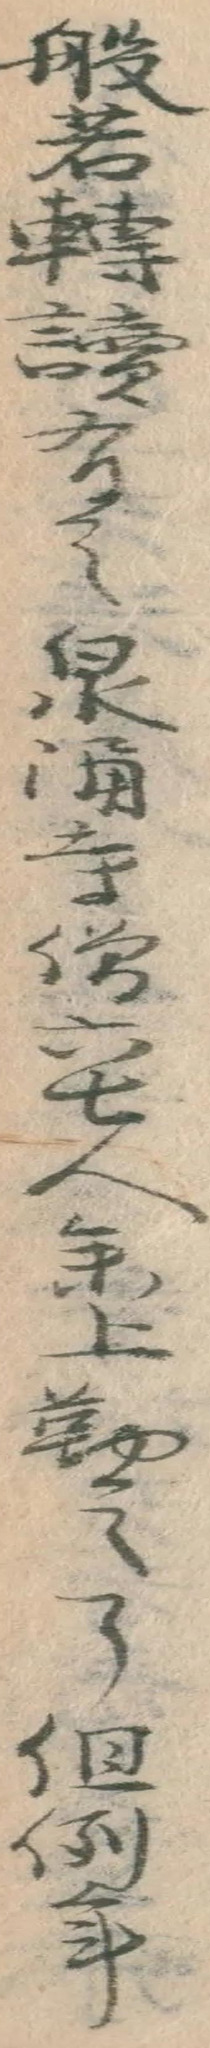般若轉讀有之泉涌寺僧六七人参上勤之了但例年

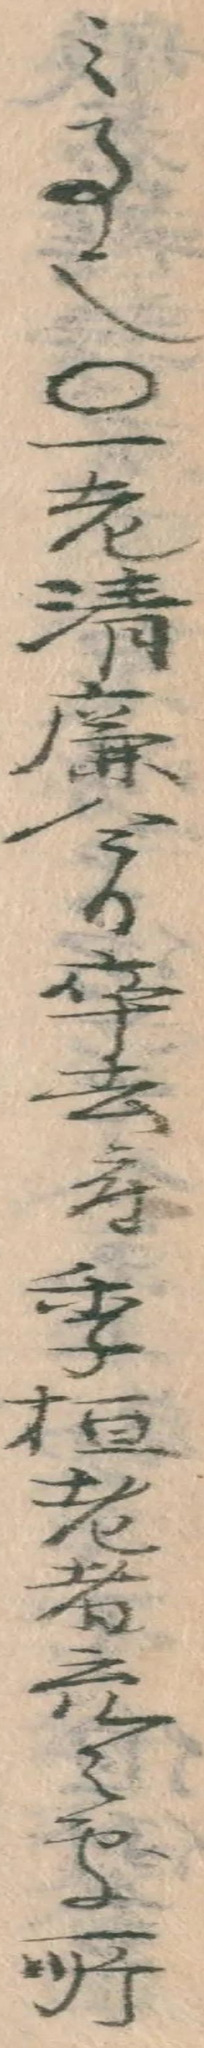之事也○一老清廉今日卒去ニ付季桓老者充之處所
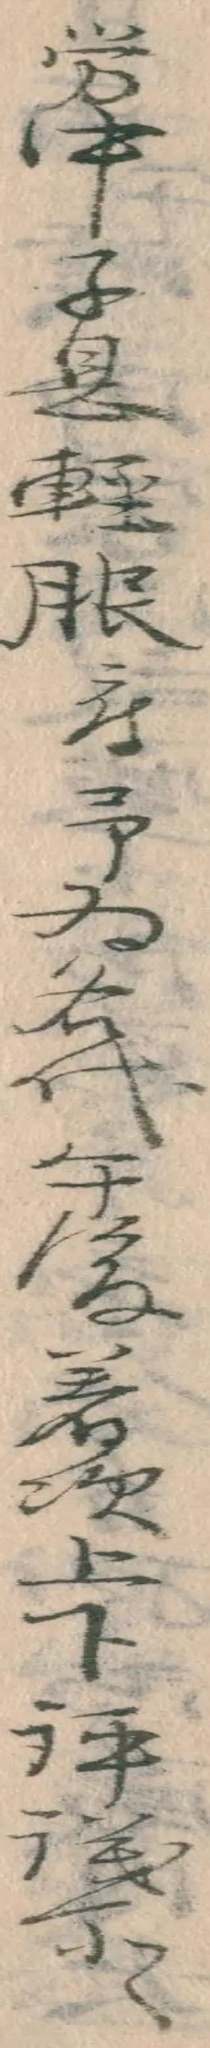労中子息軽服ニ付予為名代午後着次上下評議所へ
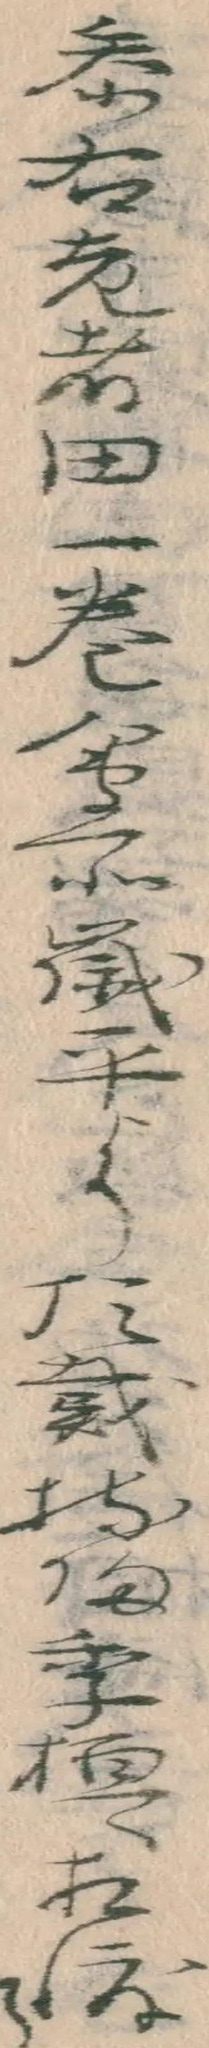参右老者田一巻會所歳平より頂戴持帰季桓へ相渡了
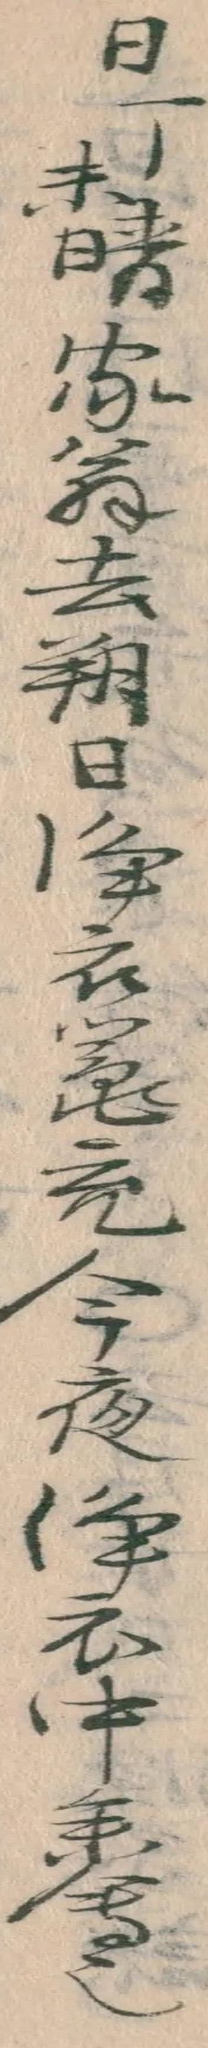六日未晴家翁去朔日浄衣鬮充今夜浄衣中参會也
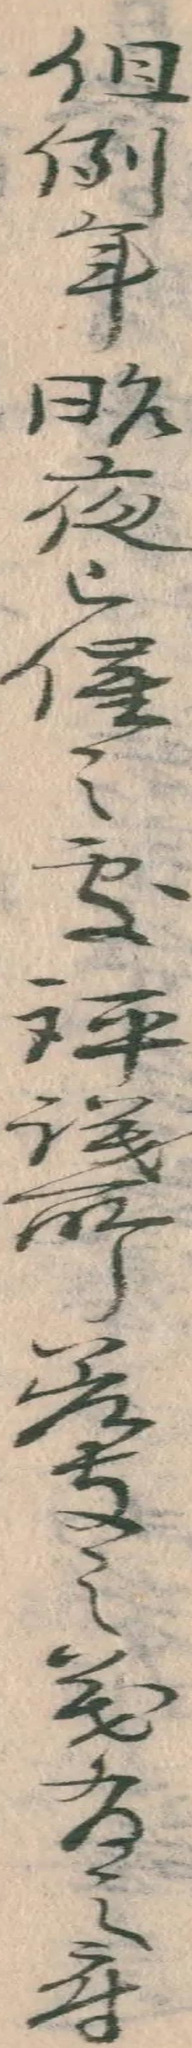但例年昨夜之催之處評議所差支之義有之ニ付
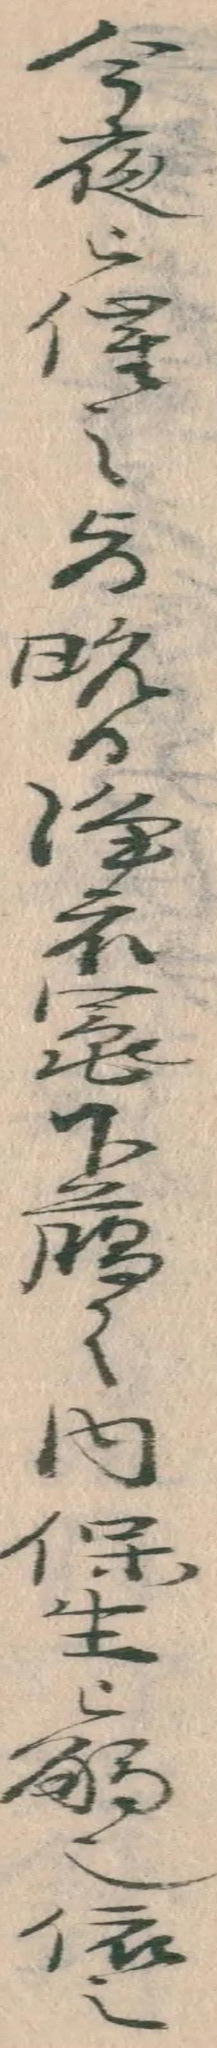今夜被催し旨昨日浄衣鬮下臈之内保生被触也依之
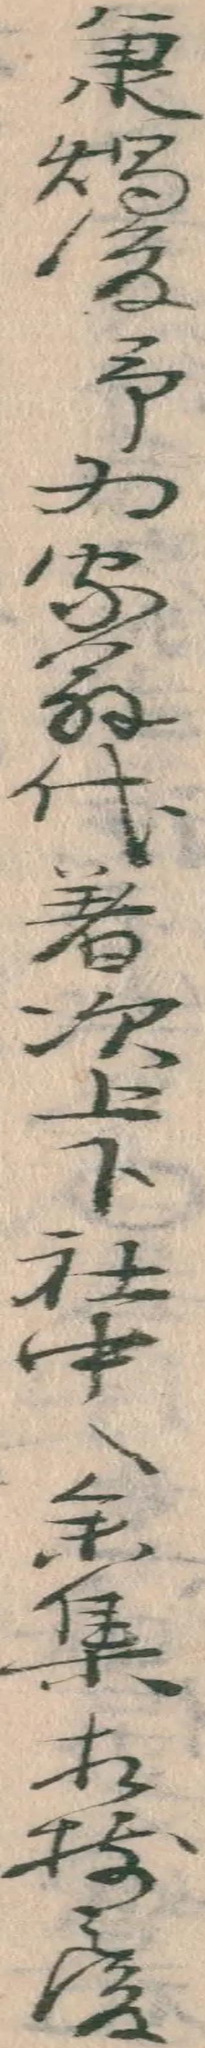兼燭後予為家翁代着次上下社中へ参集相揃之後
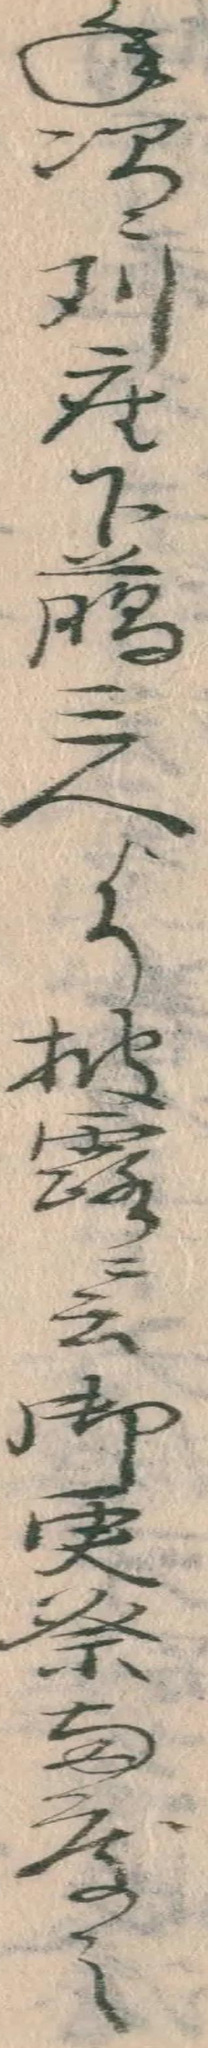年次に列座下臈三人より披露ニ云御更祭両度之
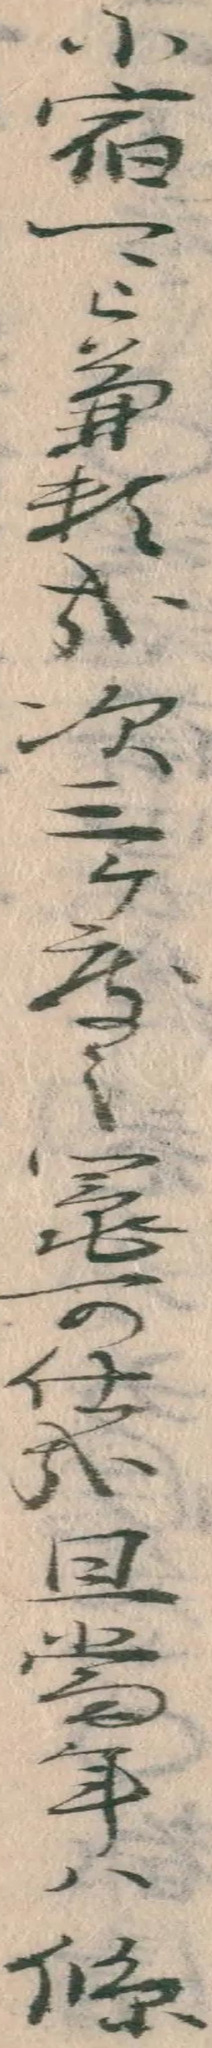小宿可被兼頼哉次三ケ度之鬮可仕哉且當年ハ條
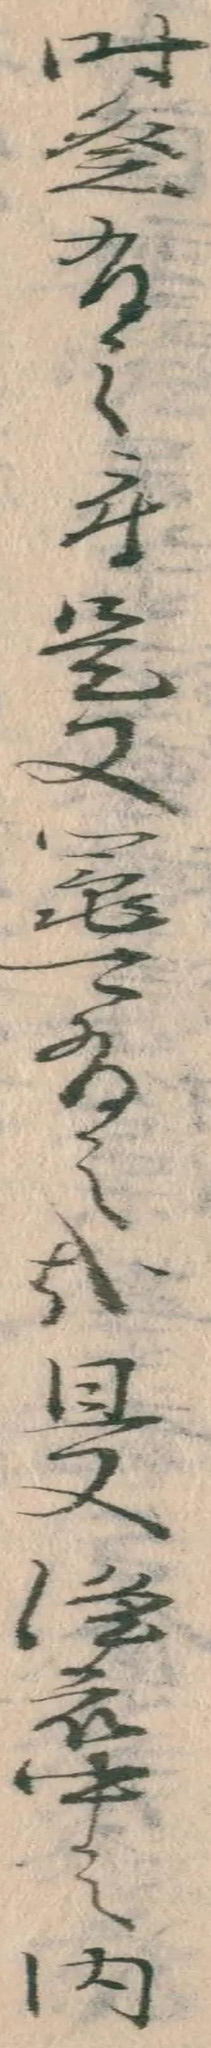時参有之ニ付是又鬮可有之哉且又浄衣中之内
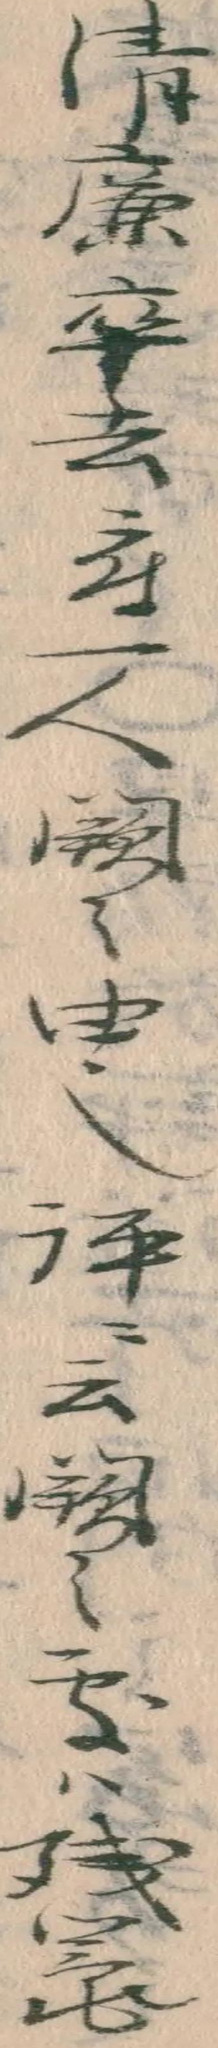清廉卒去ニ付一人闕之由也評ニ云闕之處ハ残鬮
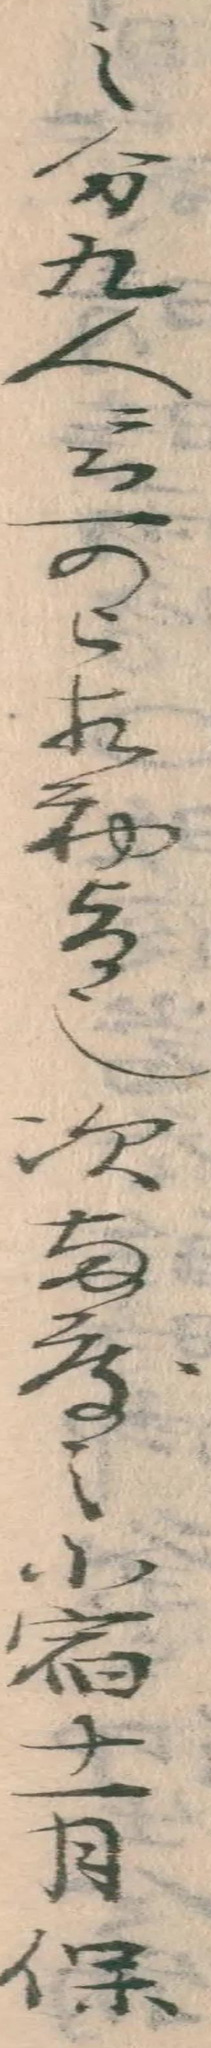之分九人ニ而可被相勤旨也次両度之小宿十一月保
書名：賀茂社記録. 第63冊
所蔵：国立国会図書館 National Diet Library, JAPAN
